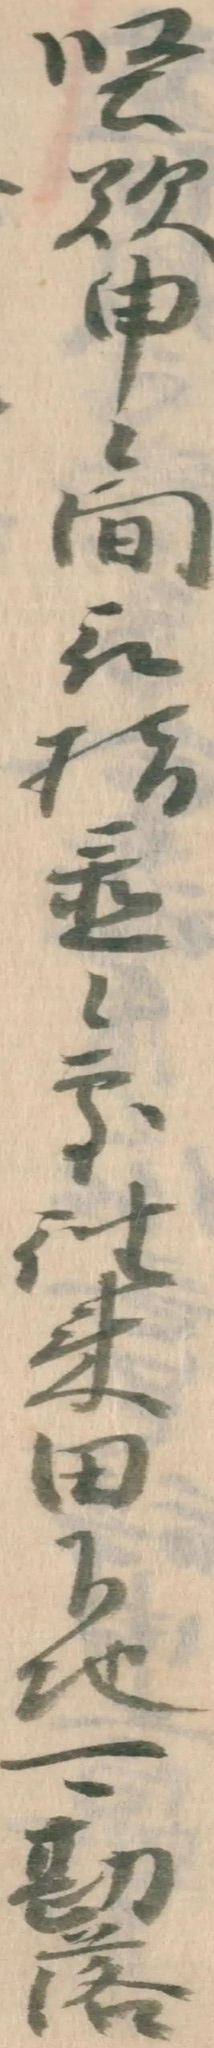堅歎申候間被指置候処往来田下地可勘落
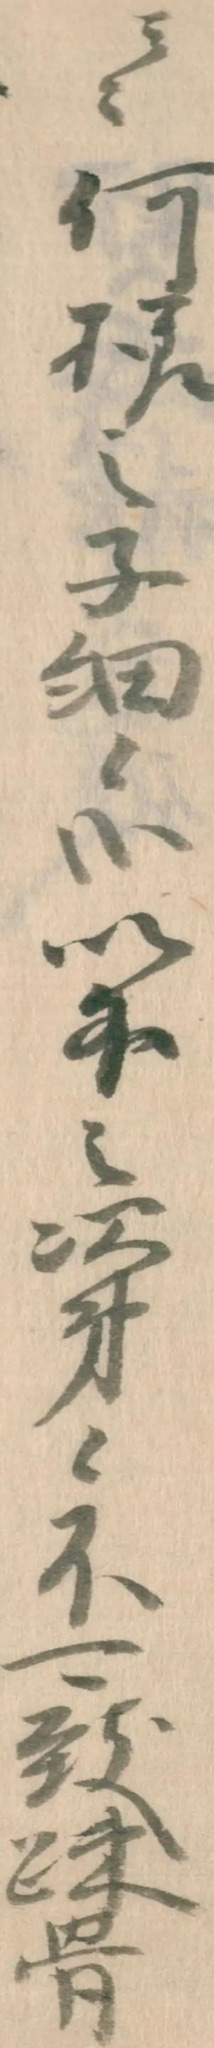云々何様之子細候哉以外之次第候不可致疎骨
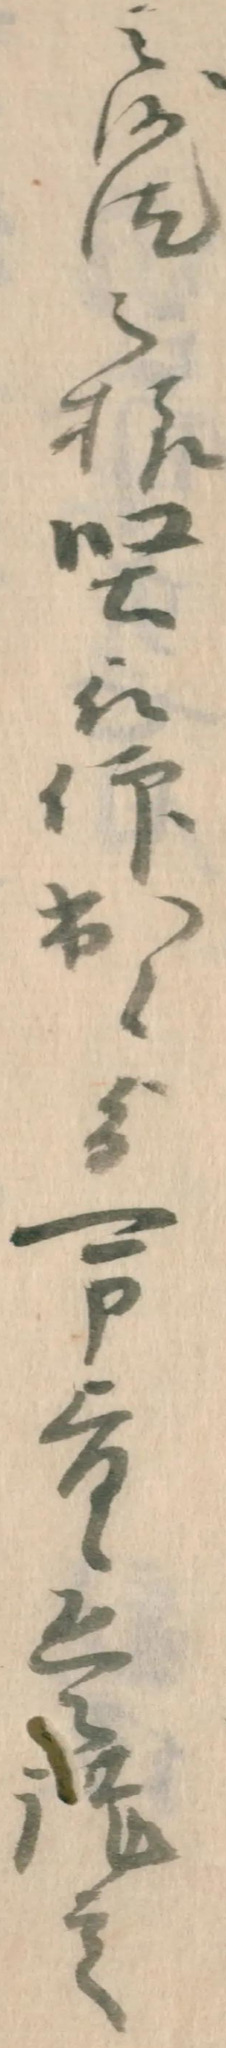之沙汰之様堅被仰出候旨可申旨候恐々謹言
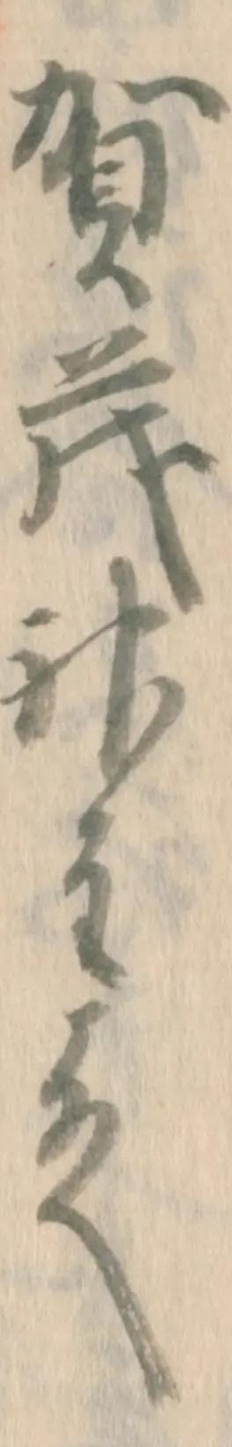賀茂神主殿
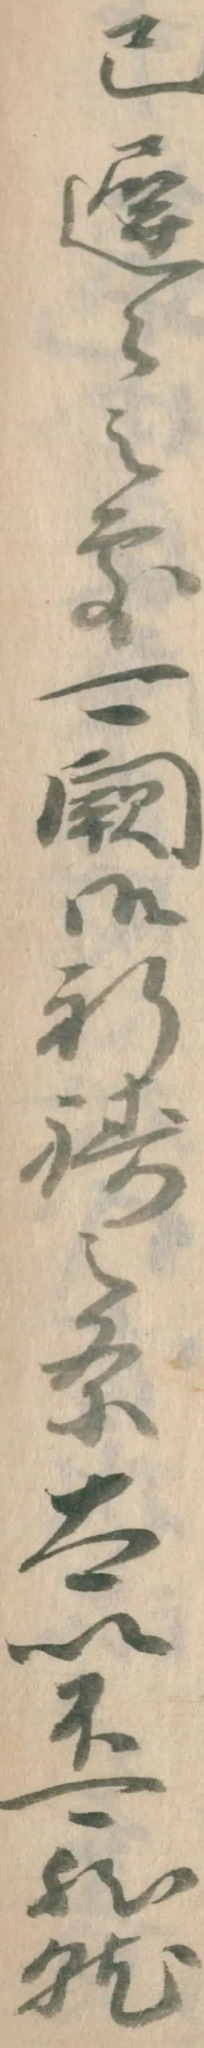已遅々之処可闕御祈祷之条太以不可然就

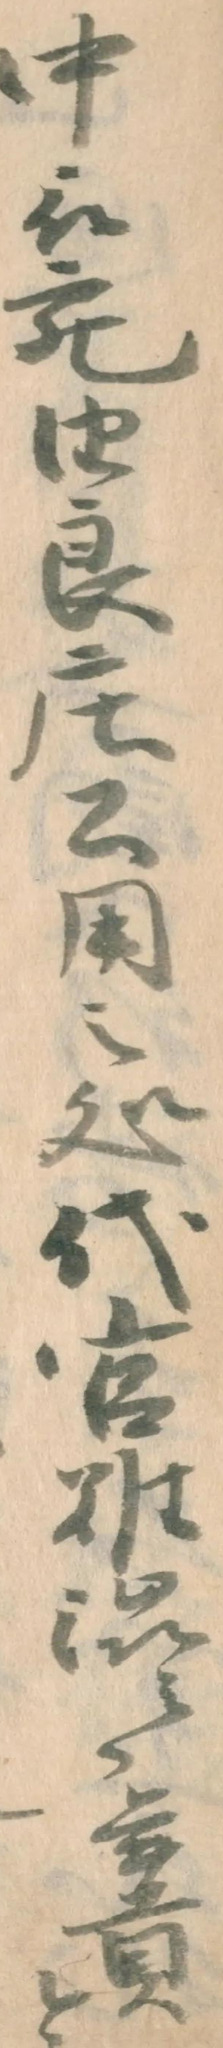中被宛由良庄公用之処代官難渋云々年貢令
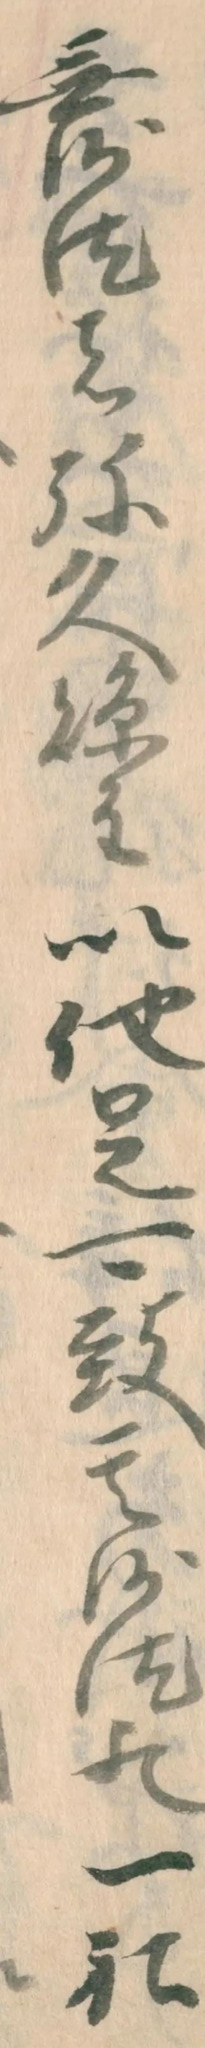無沙汰は弥久県主以他足可致其沙汰歟一社
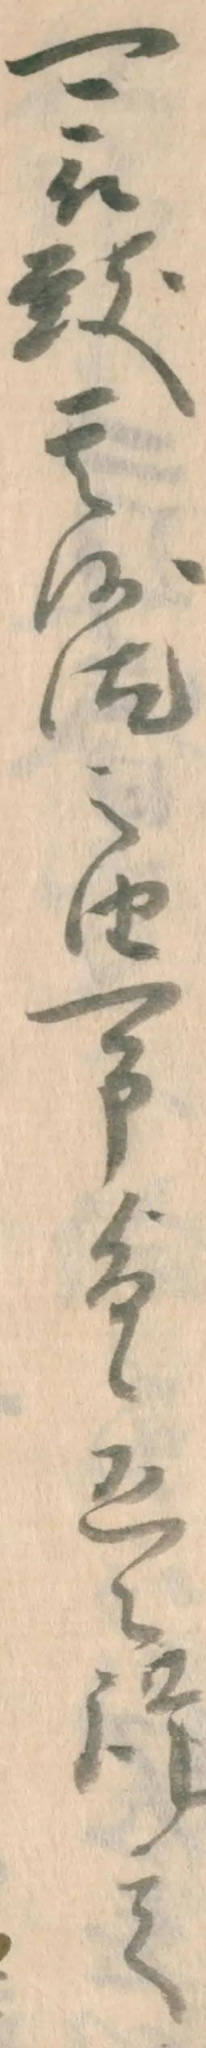可被致其沙汰之由可申旨候恐々謹言
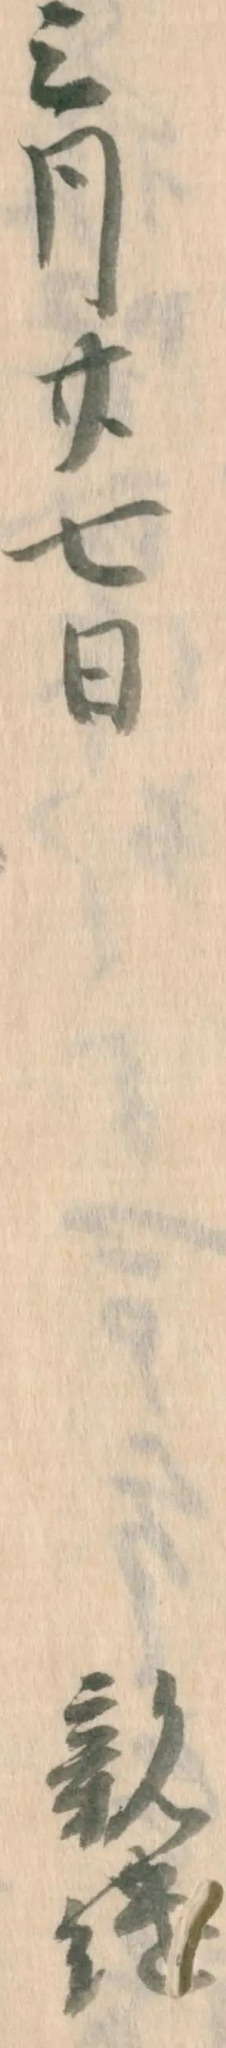三月廿七日親継
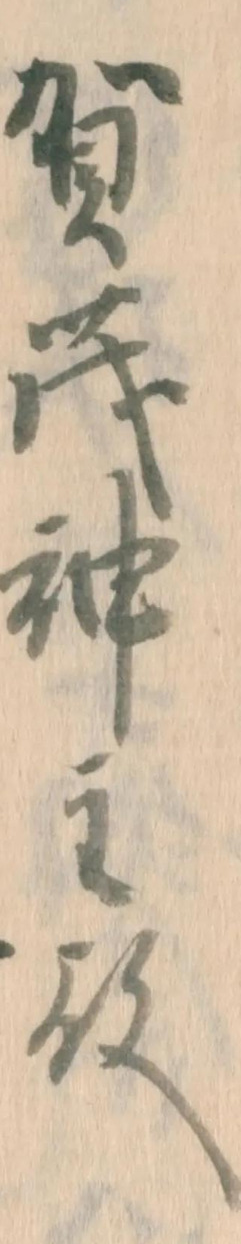賀茂神主殿
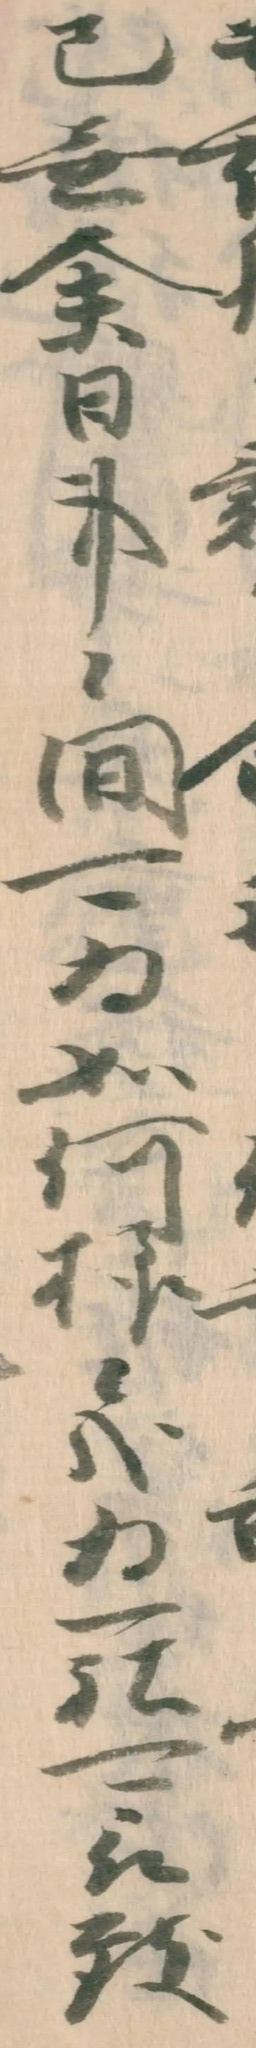已無余日事候間可為如何様候哉為一社可被致
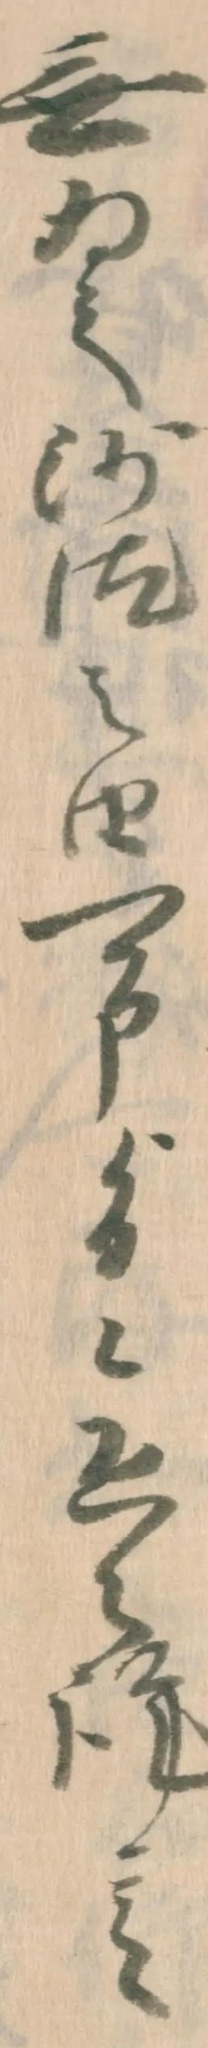無為之沙汰之由可申旨被恐々謹言
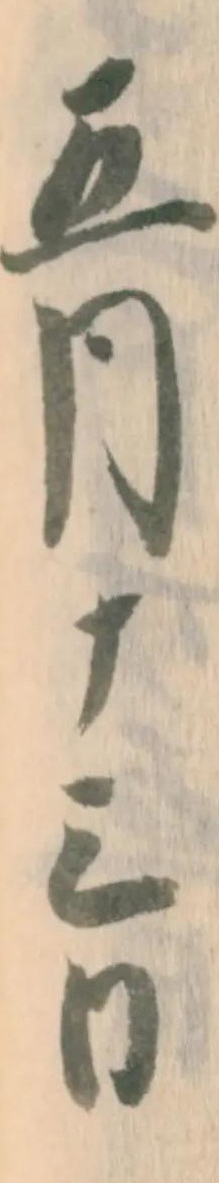五月廿三日
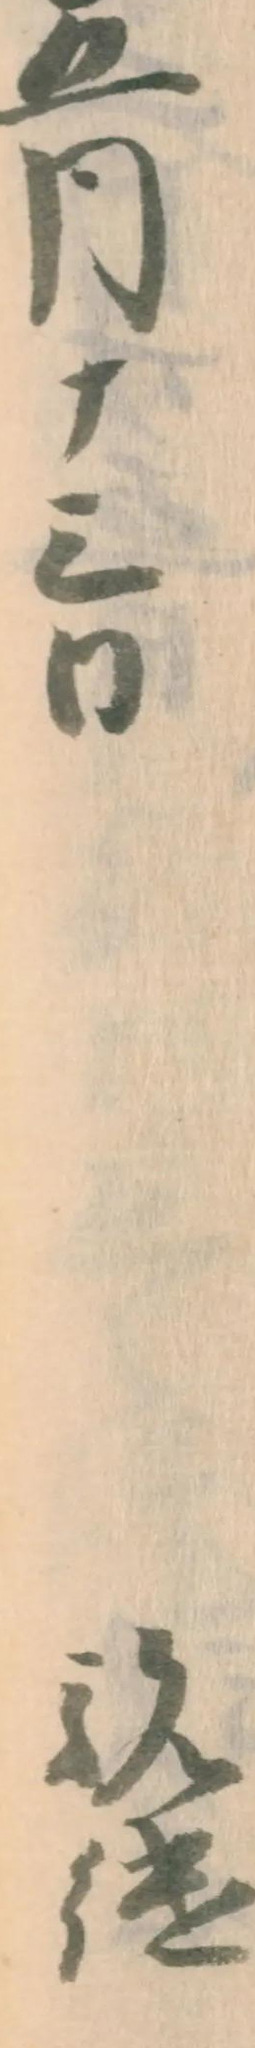五月十三日親継
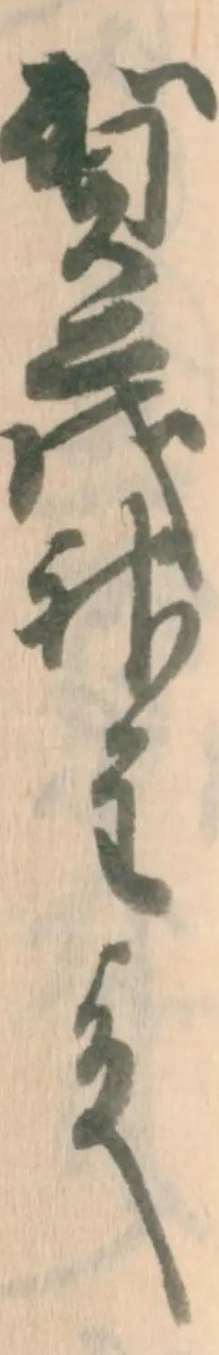賀茂神主殿
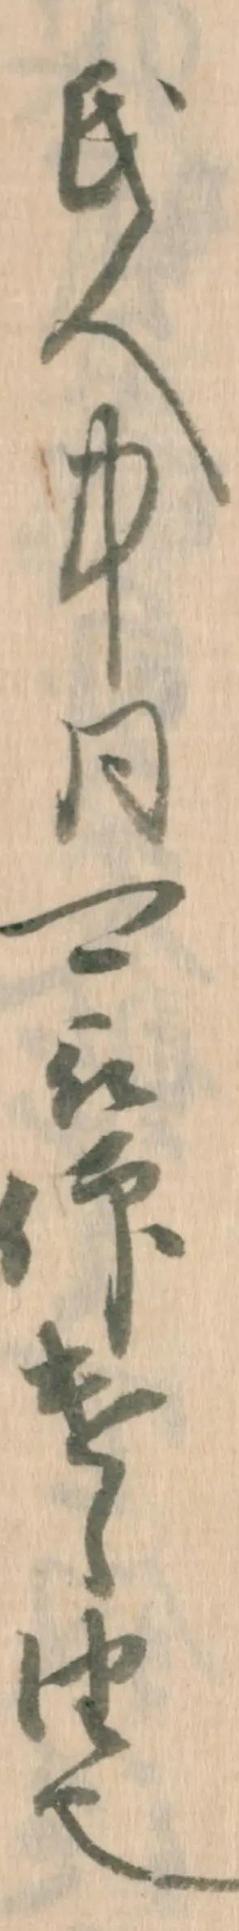氏人中同可被仰遣候由也
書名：賀茂社記録. 第1冊
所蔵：国立国会図書館 National Diet Library, JAPAN
